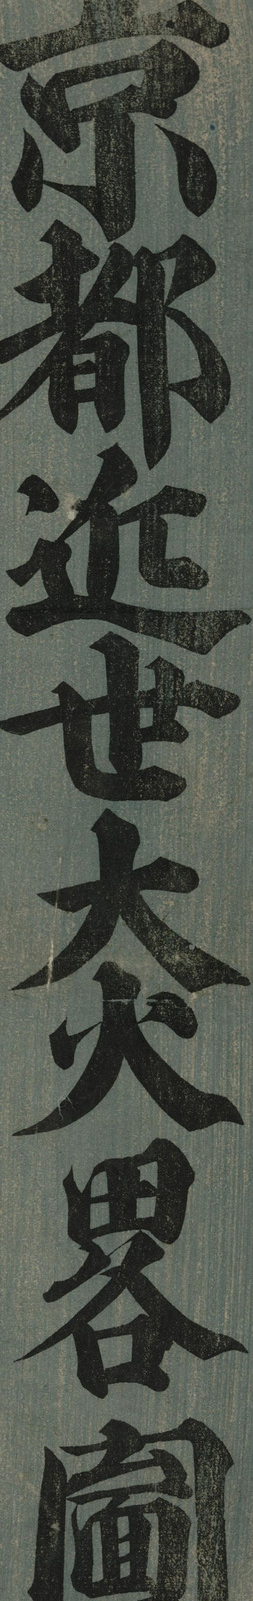京都近世大火畧圖
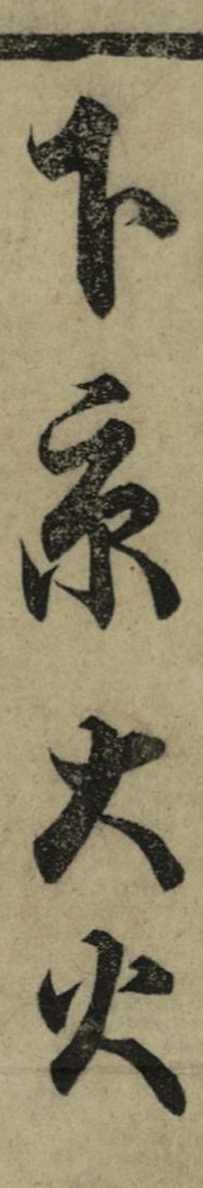下京大火
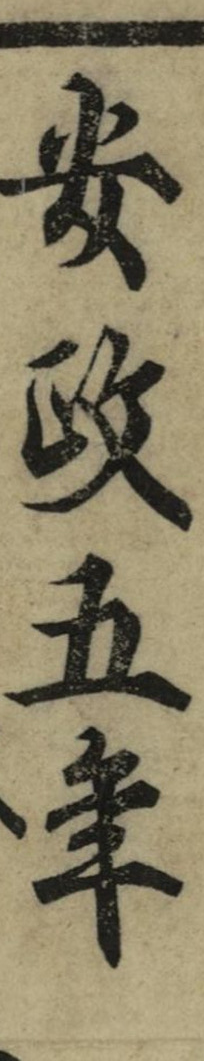安政五年
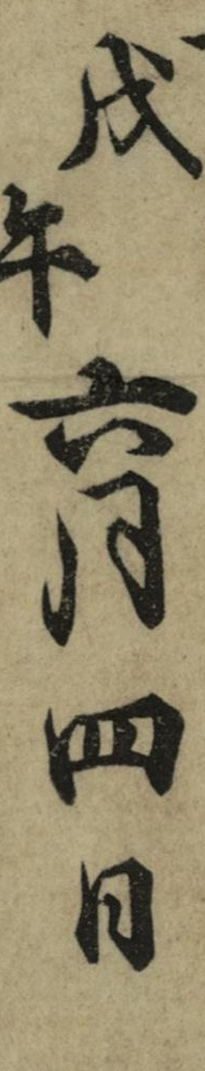戌午六月四日
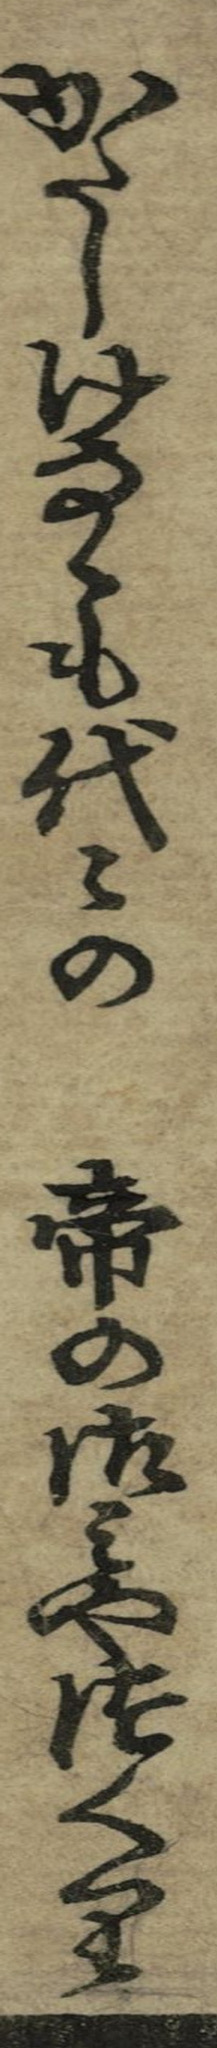かたしけなくも代〻の帝の御みやつくり
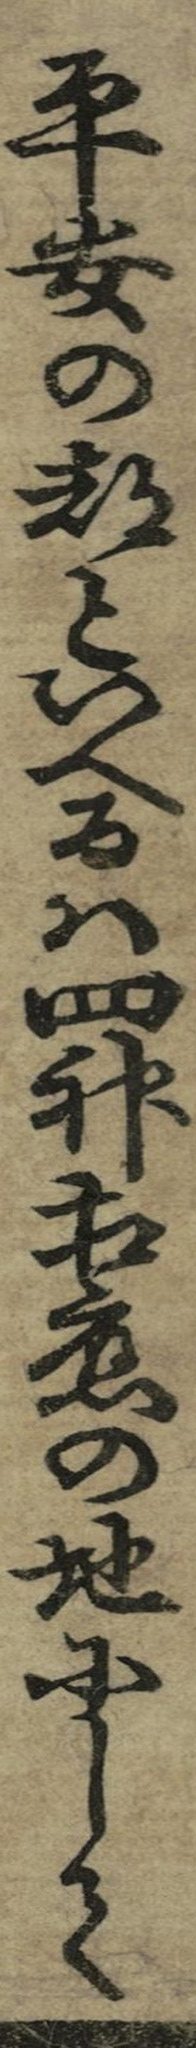平安の都といへるハ四神相應の地にして
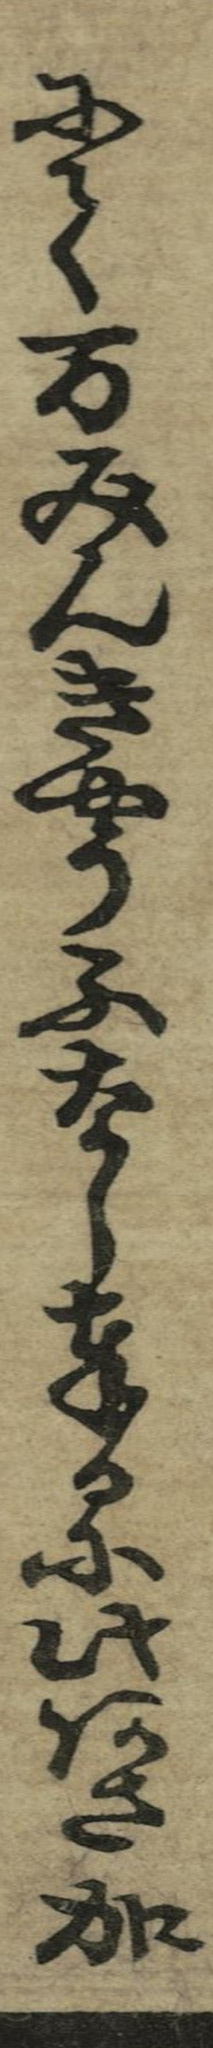にて万みんきゃうふなし奉るに此あさ加
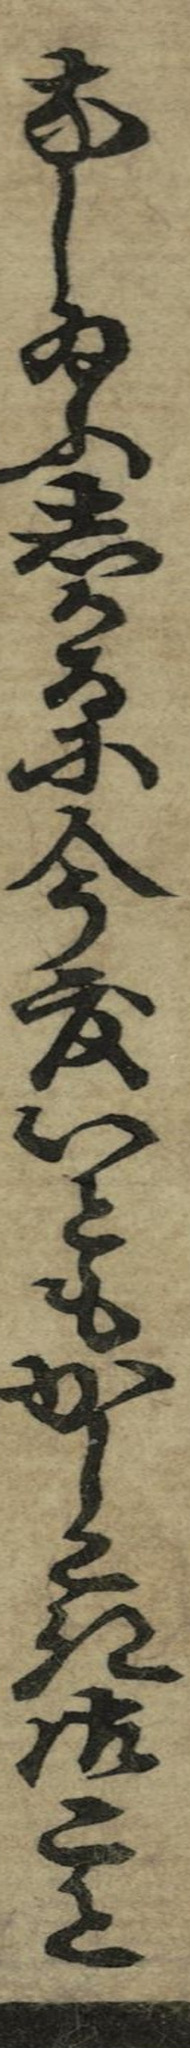なし為ふしかるに今度いともかしこき御こと
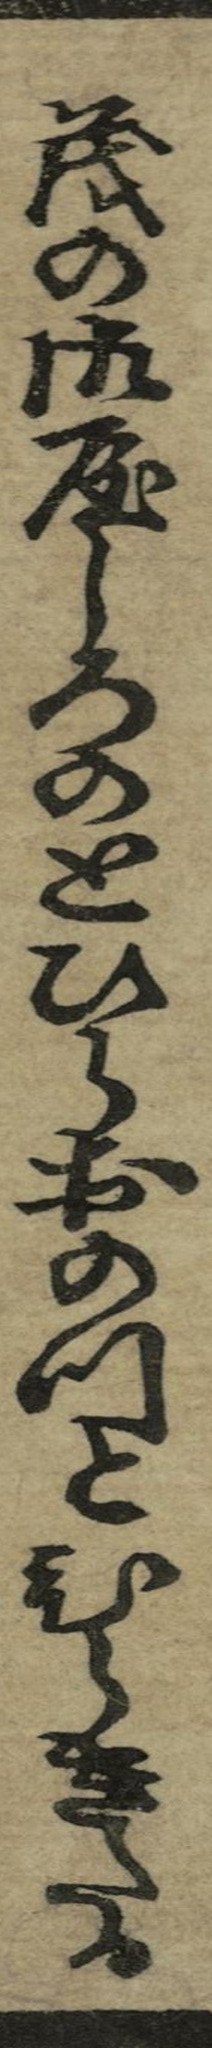茂の御屋しろのとひらおのつとひらきたる
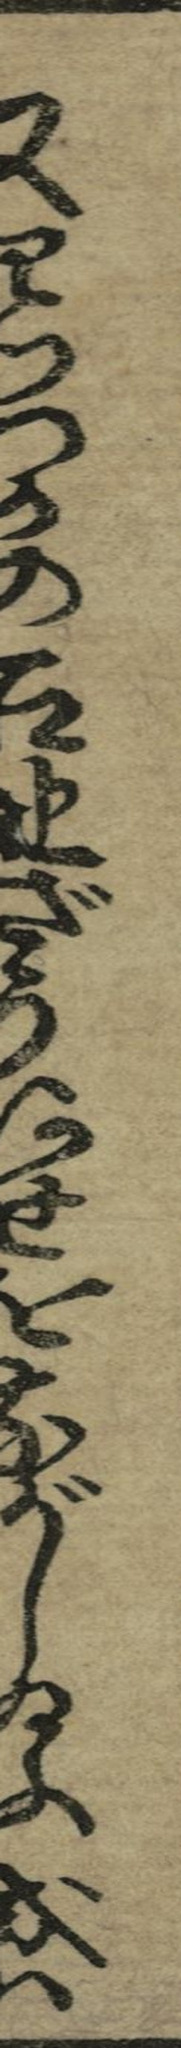又四つつかの石地ざうあせをながし給ふ或は
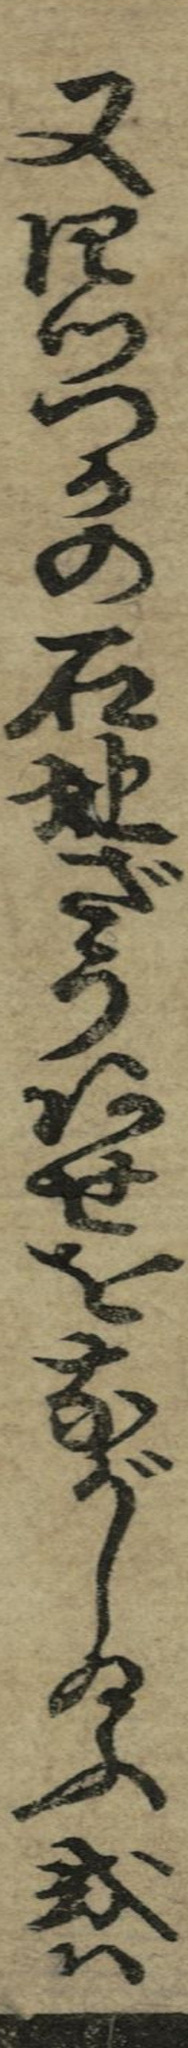又四つつかの石地ざうあせをながし給ふ或は
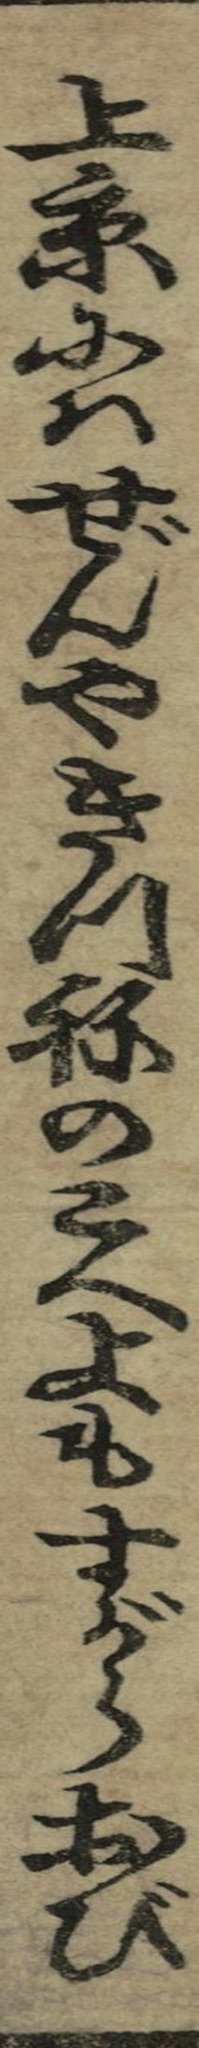上京にはぜんやきつねのこへよもすがらおび
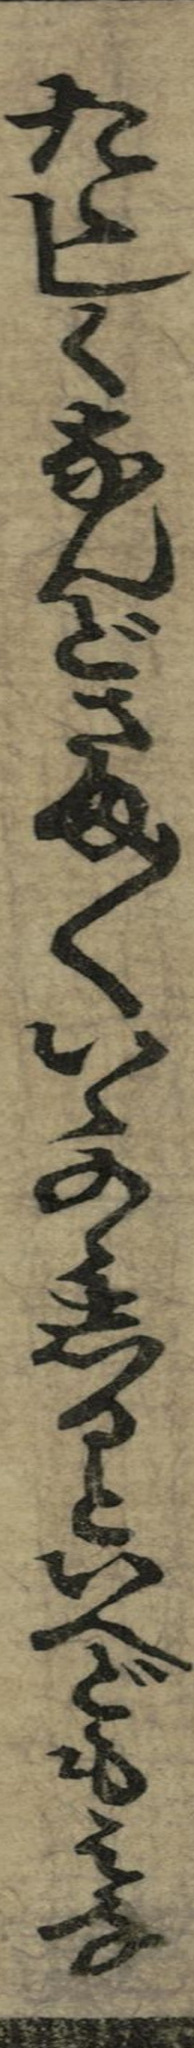たゝしくなんどさま〳〵いいののしるといへどもミな
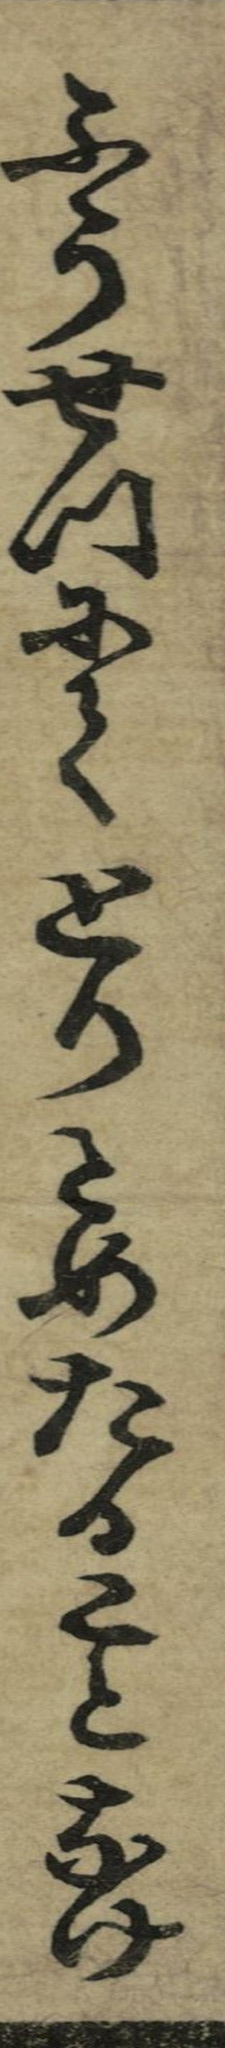ふうせつにてとりためたることなけ
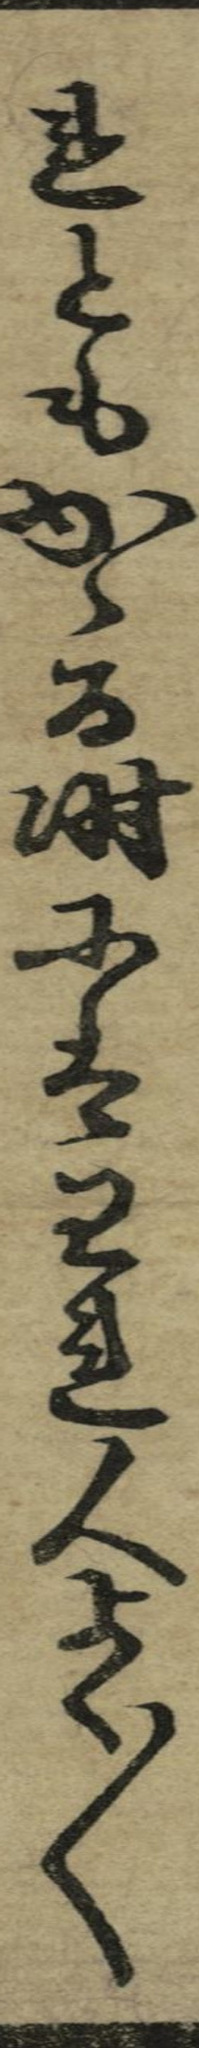れともかゝる時にはわれ人より〳〵
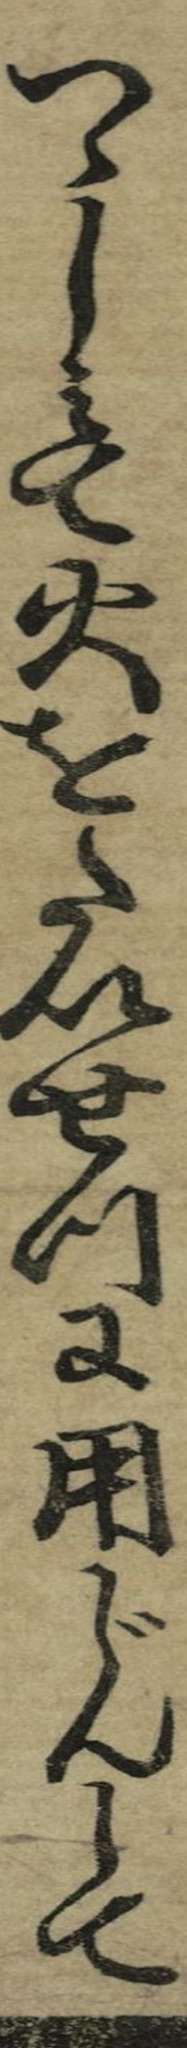つゝしみて火をたいせつに用じんして
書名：京都近世大火畧圖
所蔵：東京大学地震研究所図書室 Earthquake Research Institute Library, The University of Tokyo, JAPAN
